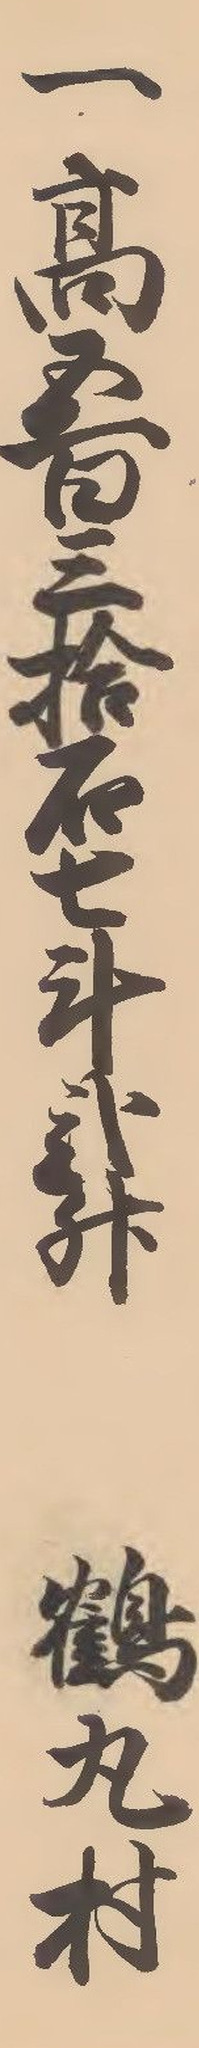一高五百三拾石七斗弐升鶴丸村
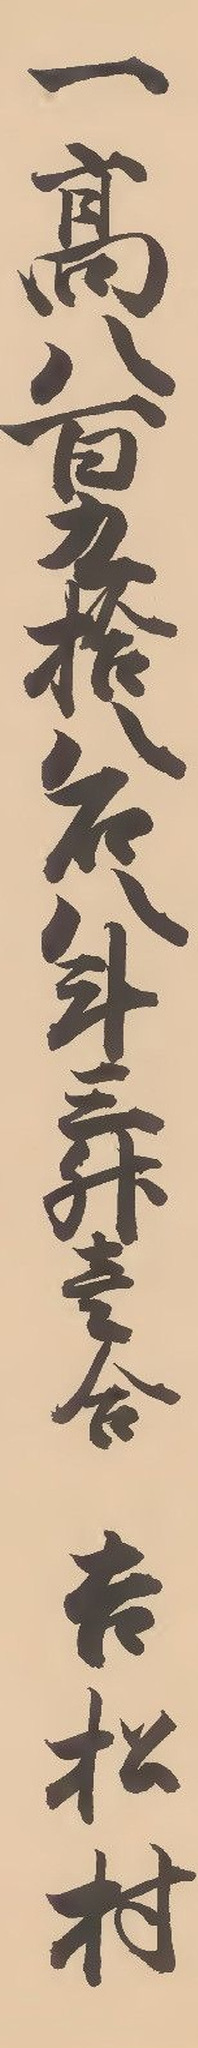一高八百九拾八石八斗三升壱合吉松村
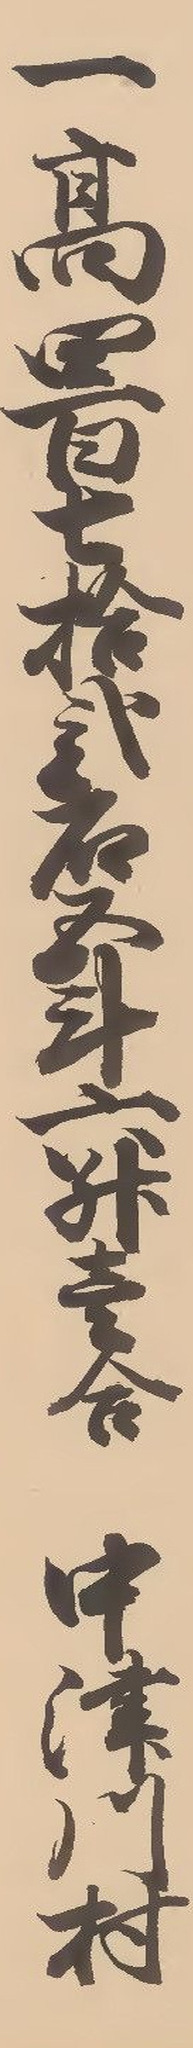一高四百七拾弐石五斗六升壱合中津川村
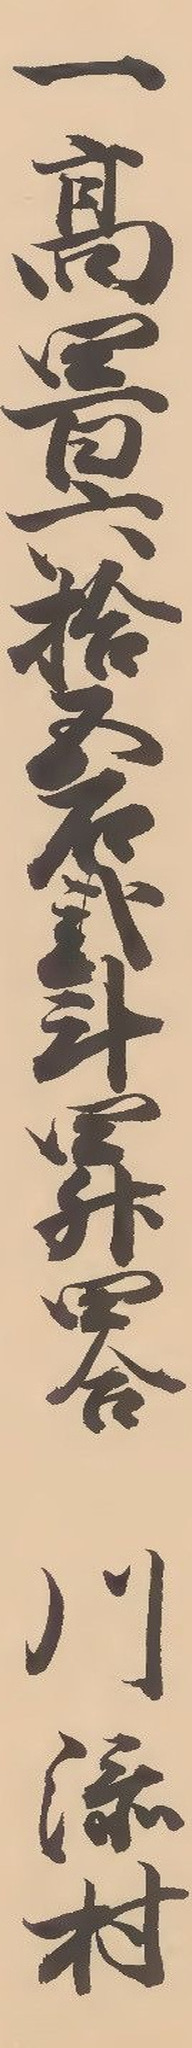一高四百六拾五石弐斗四升四合川添村
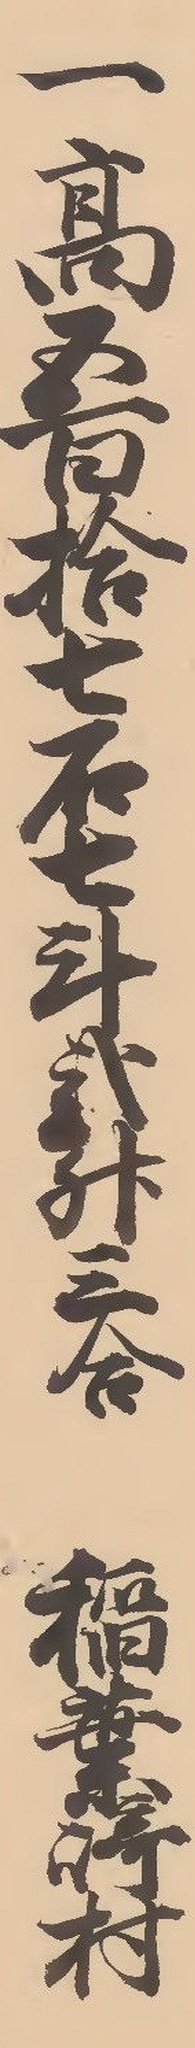一高五百拾七石七斗弐升三合稲葉崎村
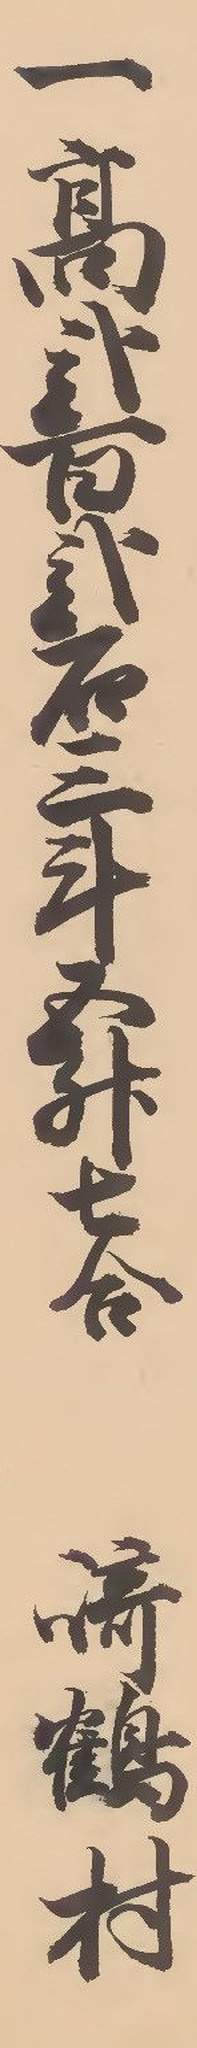一高弐百弐石三斗五升七合崎鶴村

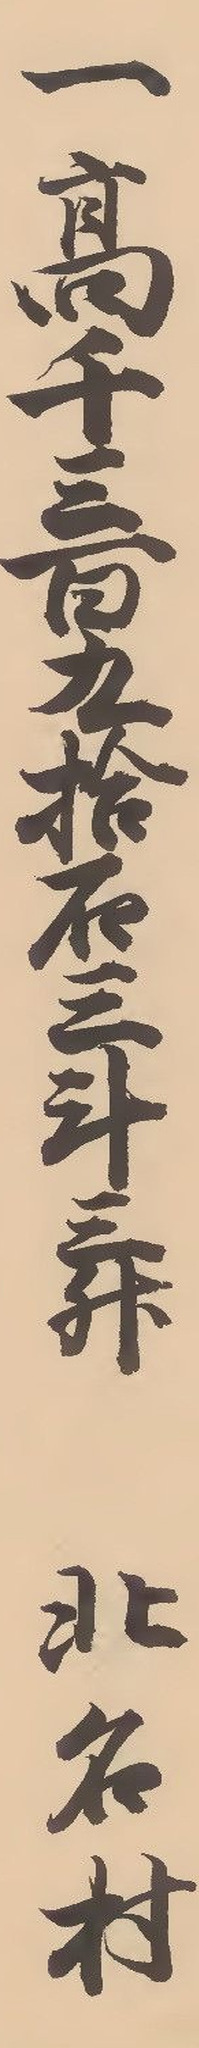一高千三百九拾石三斗三升北名村
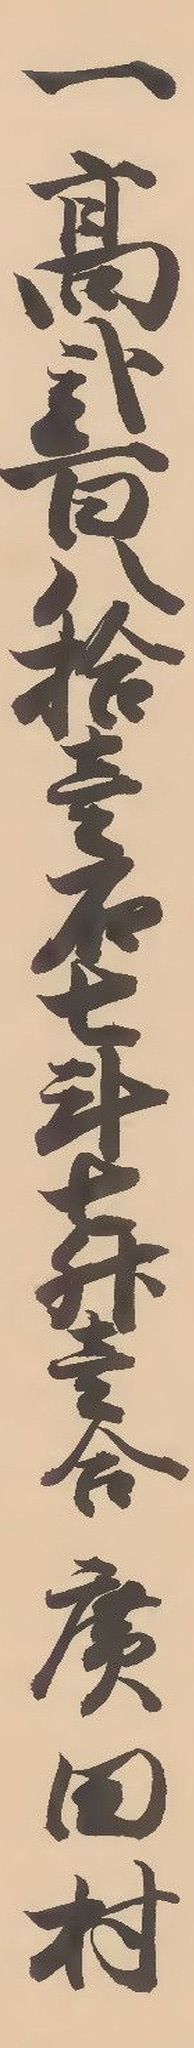一高弐百八拾壱石七斗七升壱合広田村
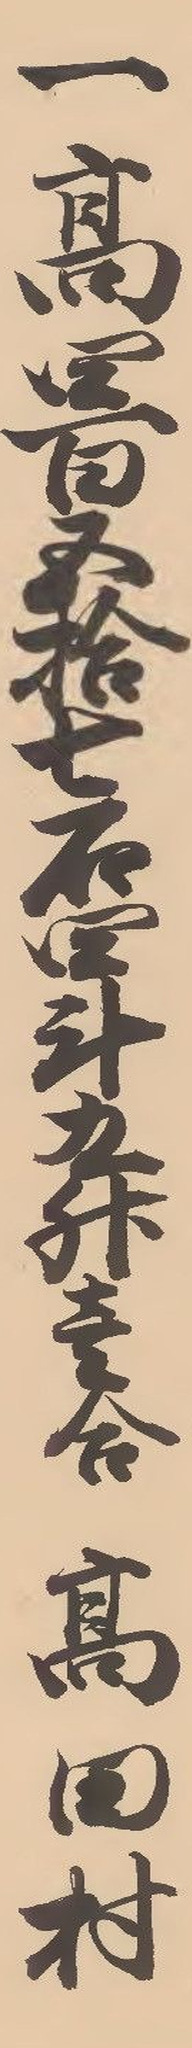一高四百五拾七石四斗九升壱合高田村
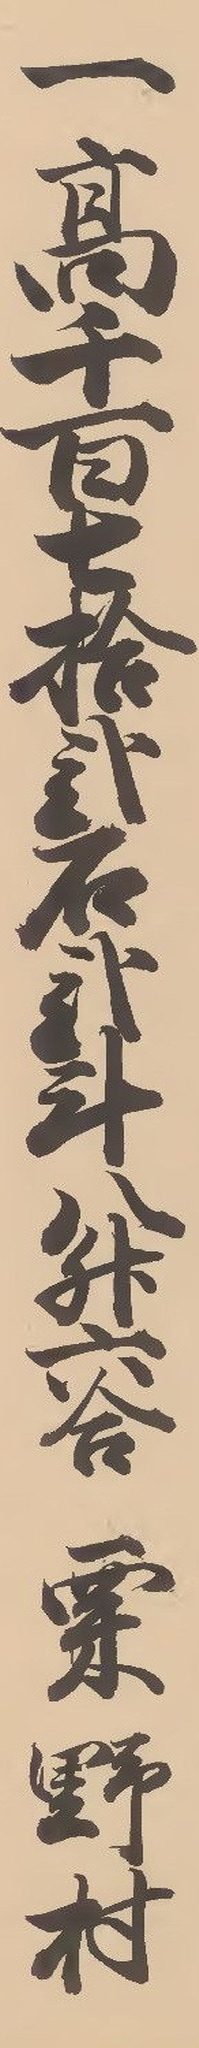一高千百七拾弐石弐斗八升六合栗野村
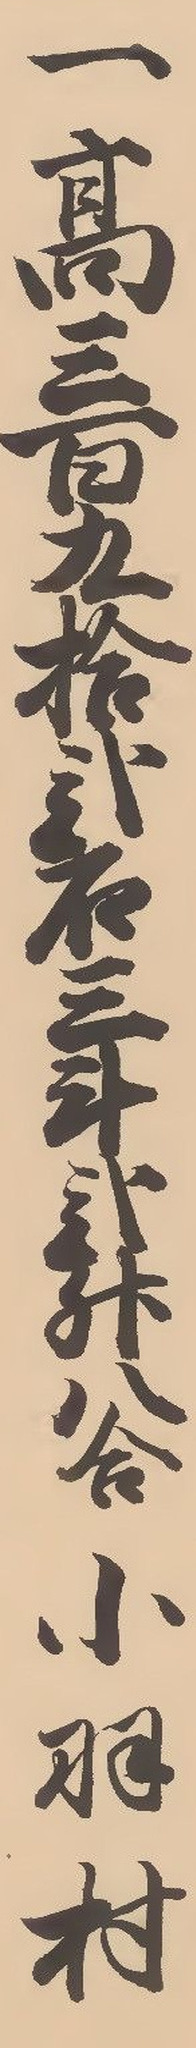一高三百九拾弐石三斗弐升八合小羽村
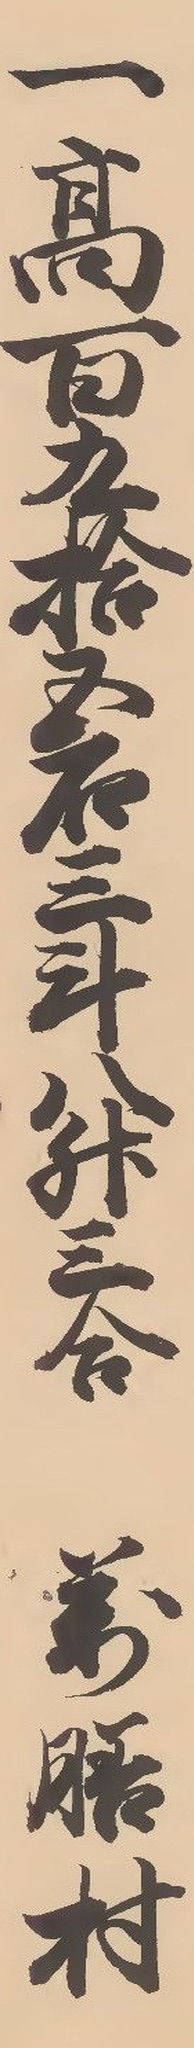一高百九拾五石三斗八升三合万膳村
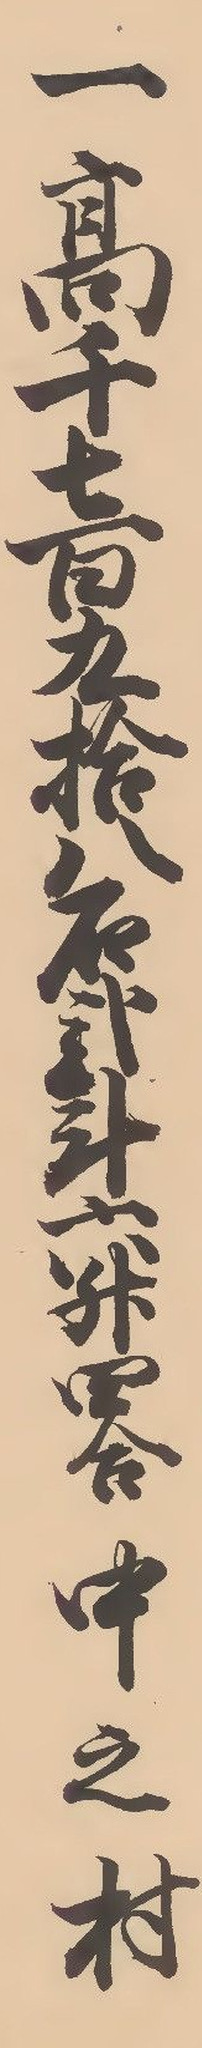一高千七百九拾八石弐斗六升四合中之村

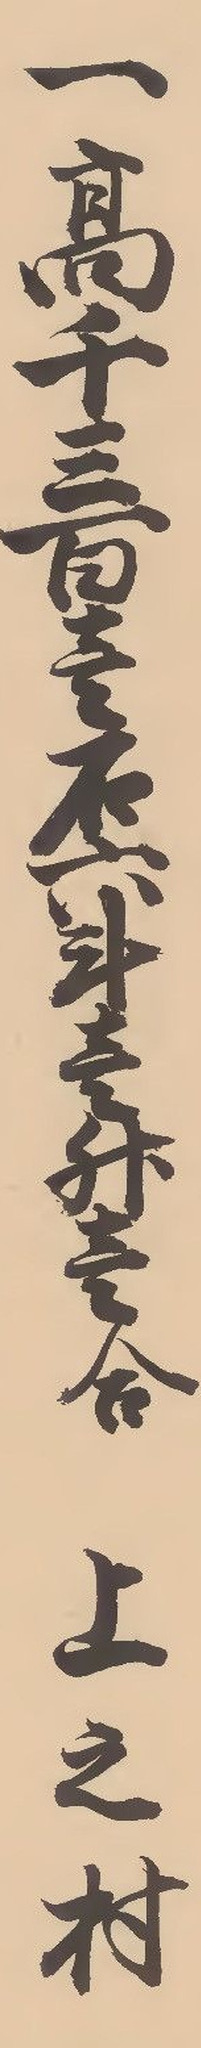一高千三百壱石六斗壱升壱合上之村
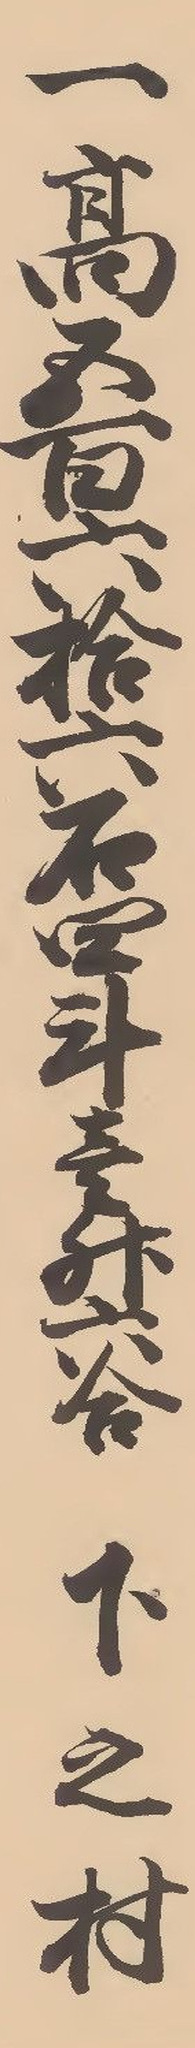一高五百六拾六石四斗壱升六合下之村
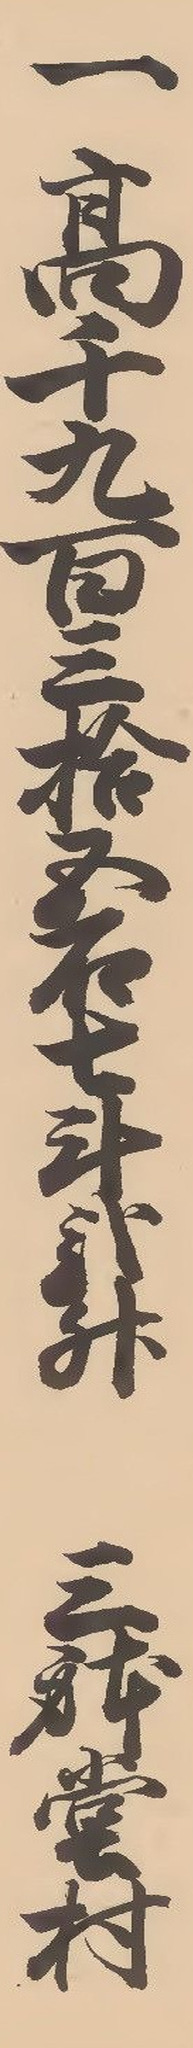一高千九百三拾五石七斗弐升三体堂村
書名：大隅国郷帳
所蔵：国立公文書館 National Archives of Japan
